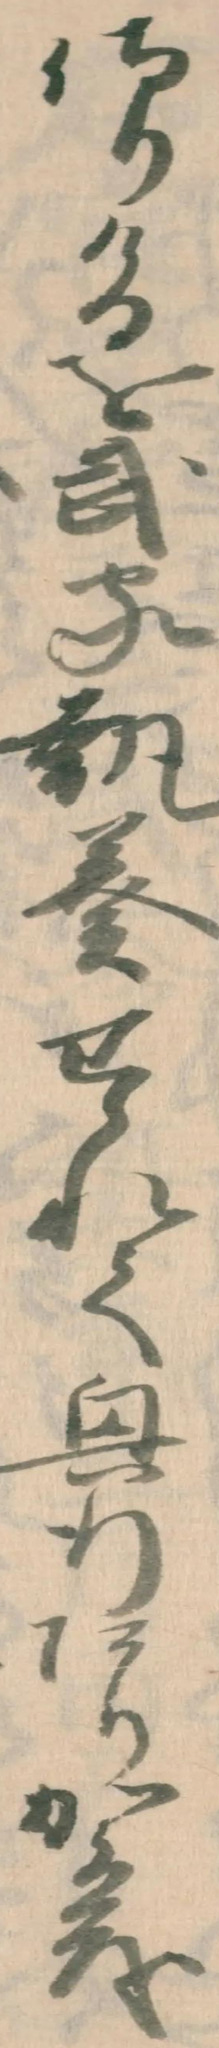侍りけるを武家執奏せられて興行あり賀茂
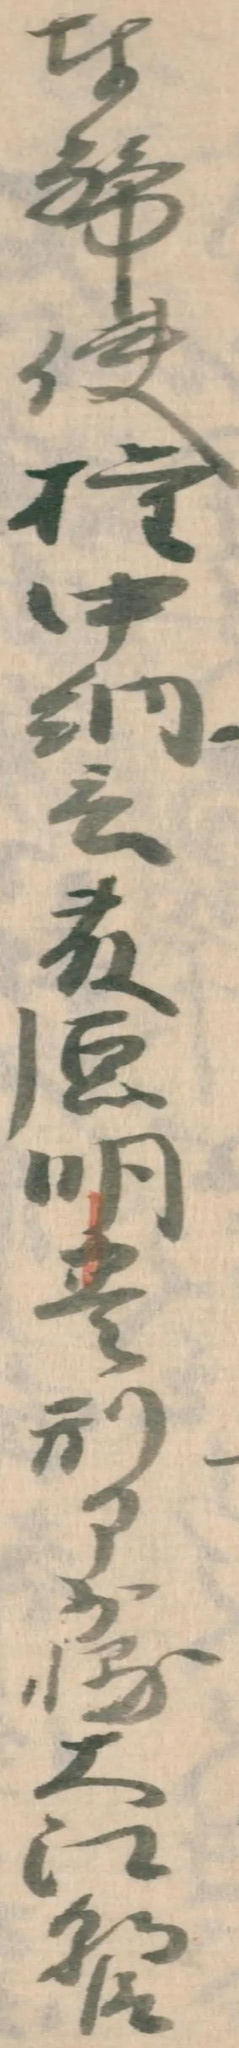奉幣使権中納言藤原明-豊刑部少輔大江朝臣
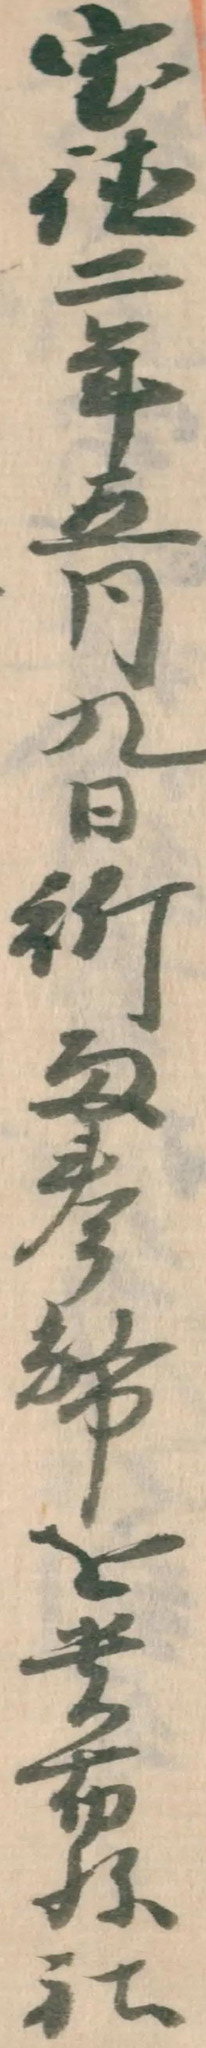宝徳二年五月九日祈雨奉幣を貴ふね社
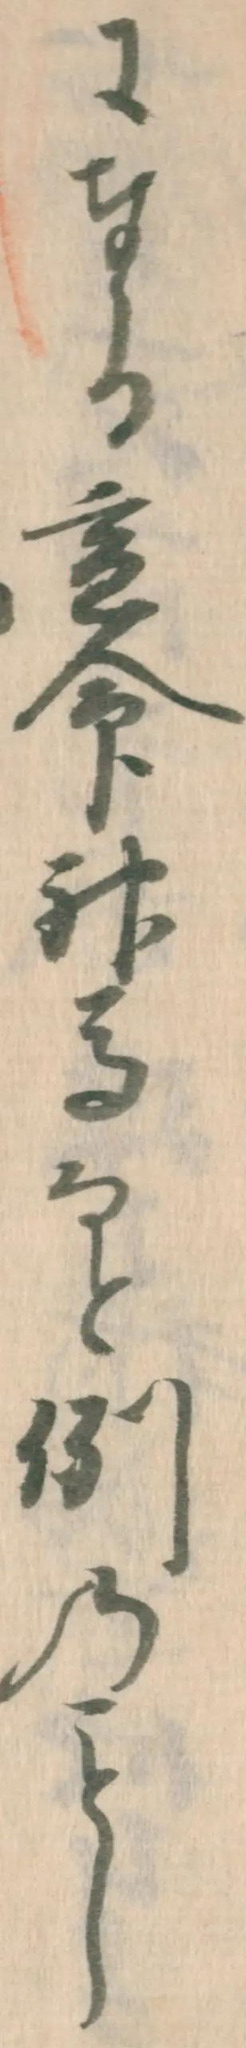に奉らる宣命神馬なと例のことし
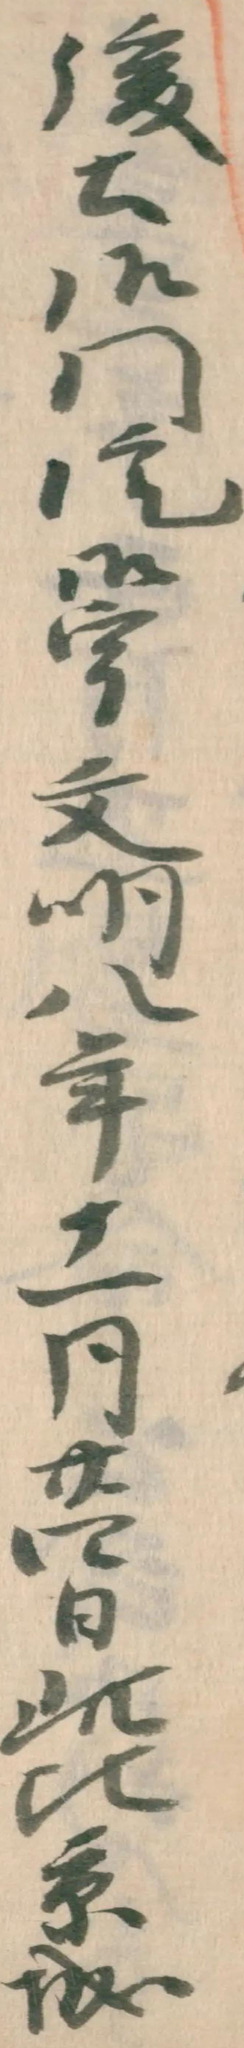後土御門院御宇文明八年十一月廿四日此比京城
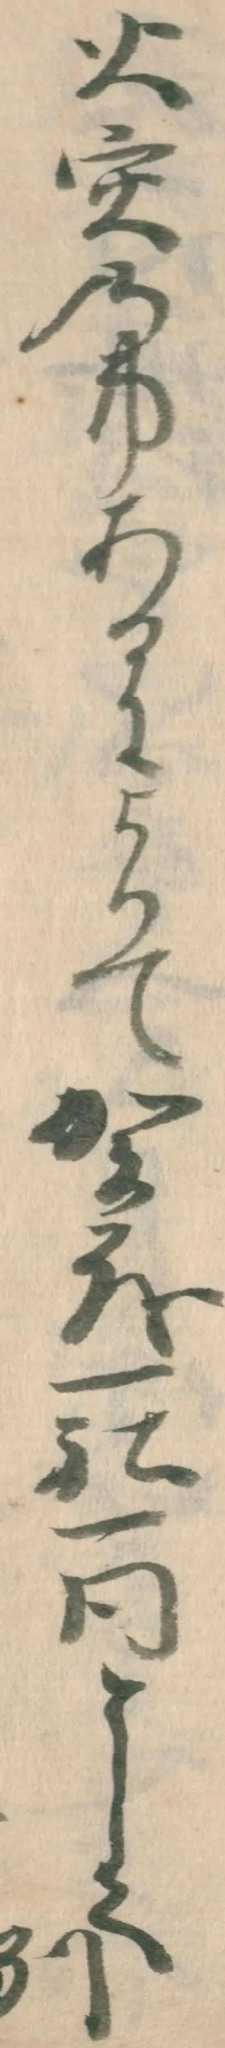火災の事あるによりて賀茂一社一同として別
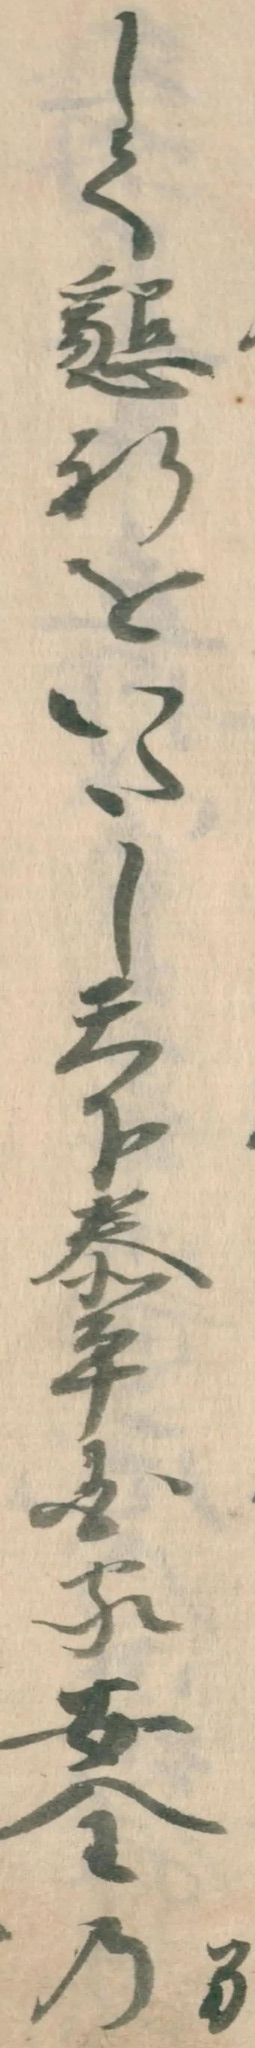して懇祈をいたし天下泰平国家安全の
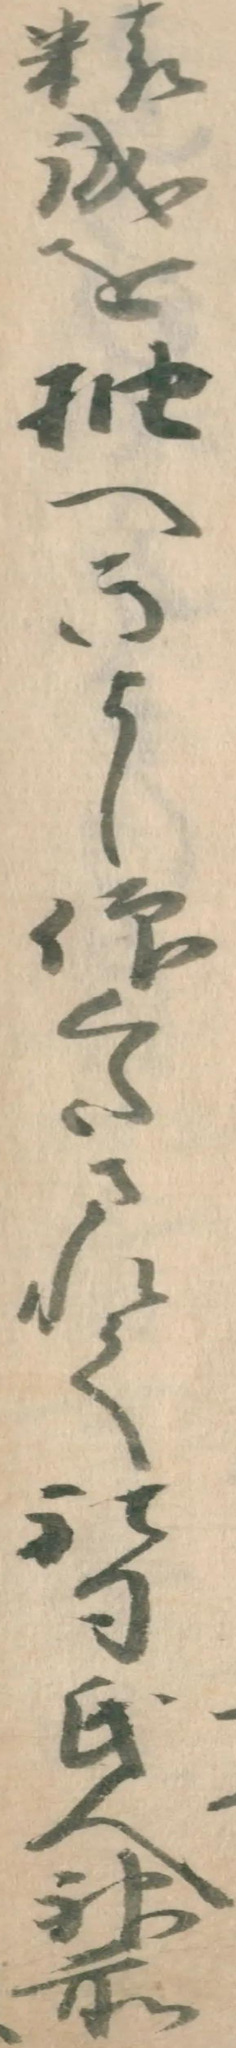精誠を抽へきよし仰くたされて社司氏人神前に

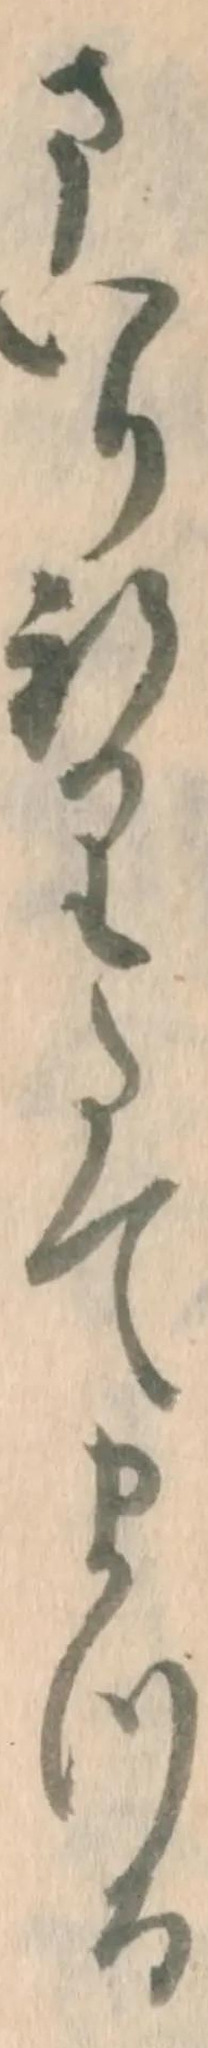まいり祈りたてまつる
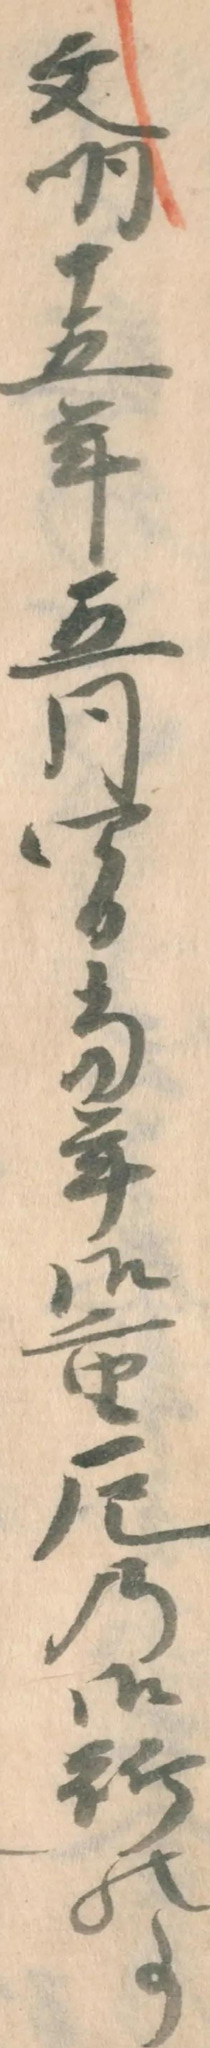文明十五年五月四日当年御重厄の御祈の事
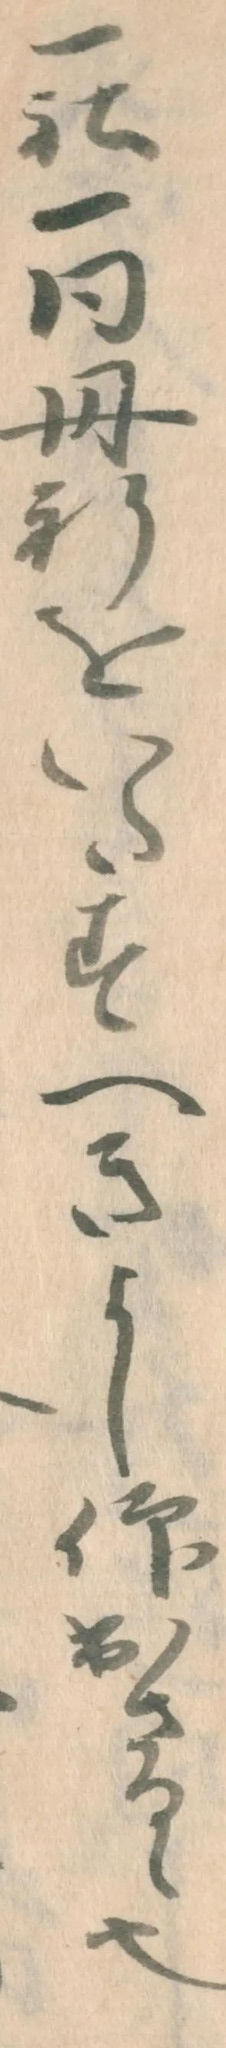一社一同丹祈をいたすへきよし仰出さるゝ也
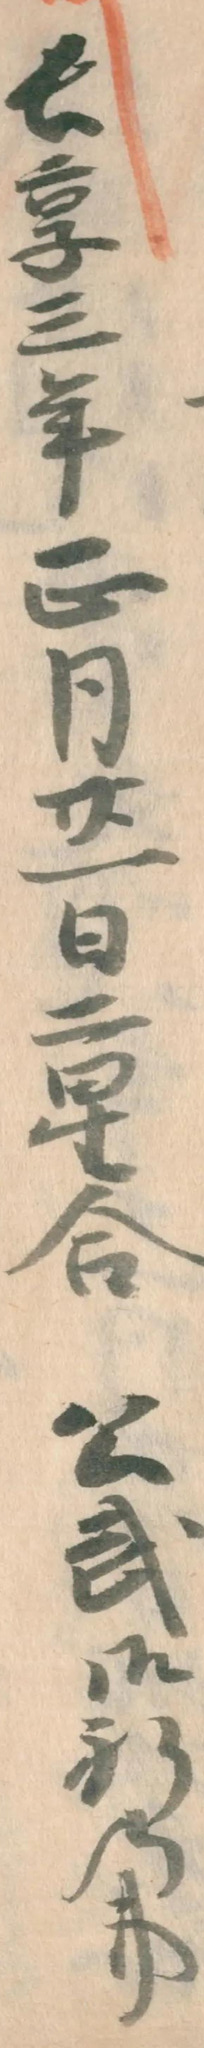長享三年正月廿一日二星合公武御祈の事
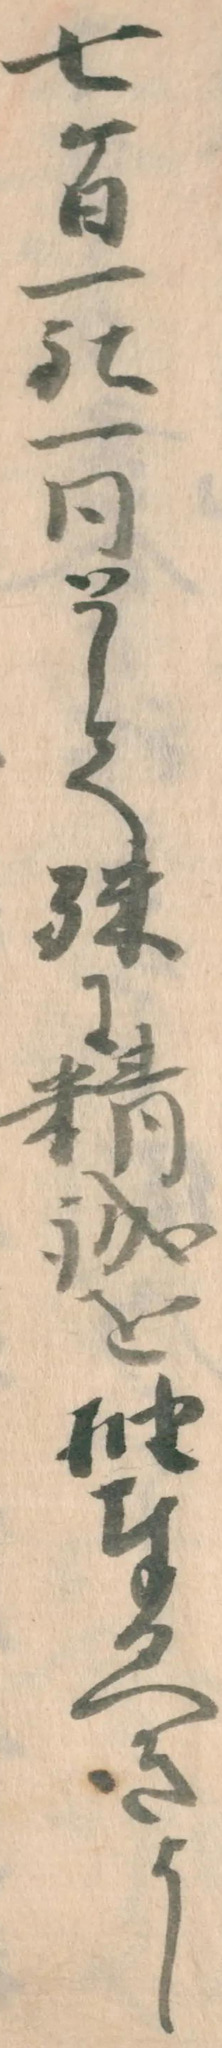七ケ日一社一同として殊に精誠を抽奉るへきよし
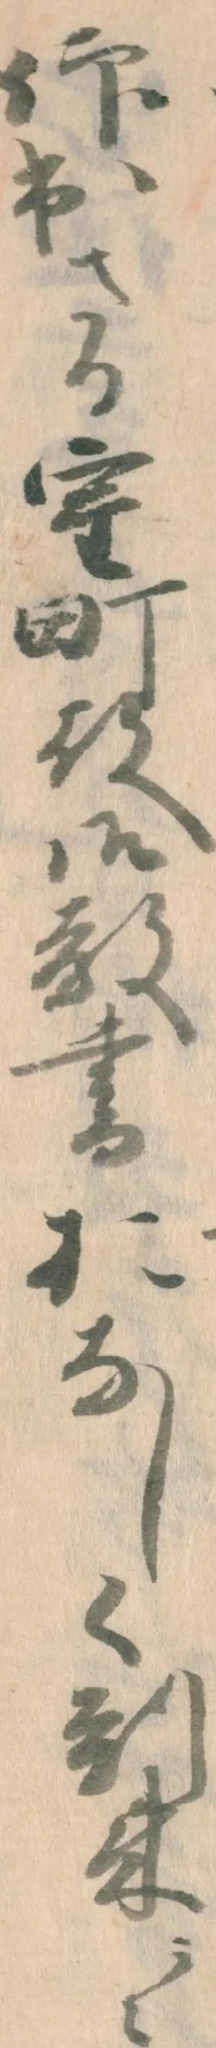仰出さる宝町殿御教書おなしく到来云々
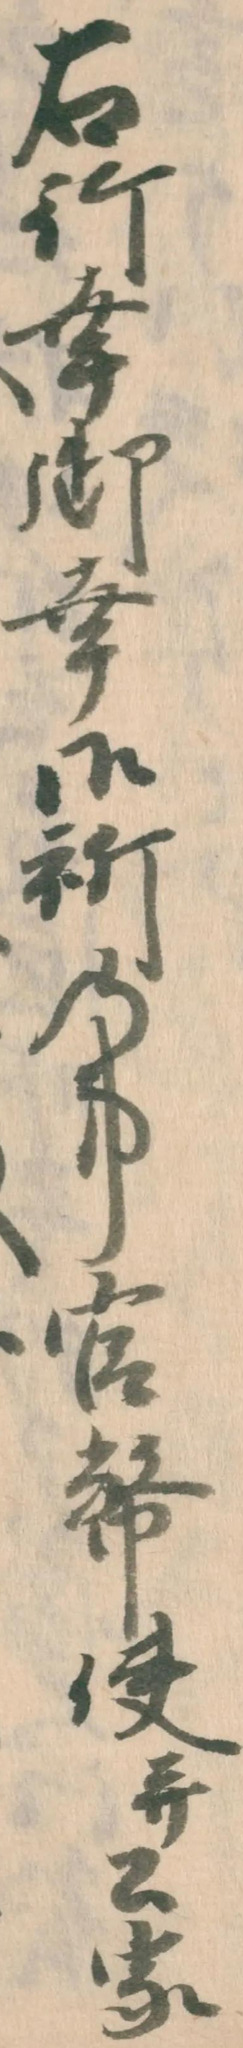右行幸御幸御祈の事官幣使并公家
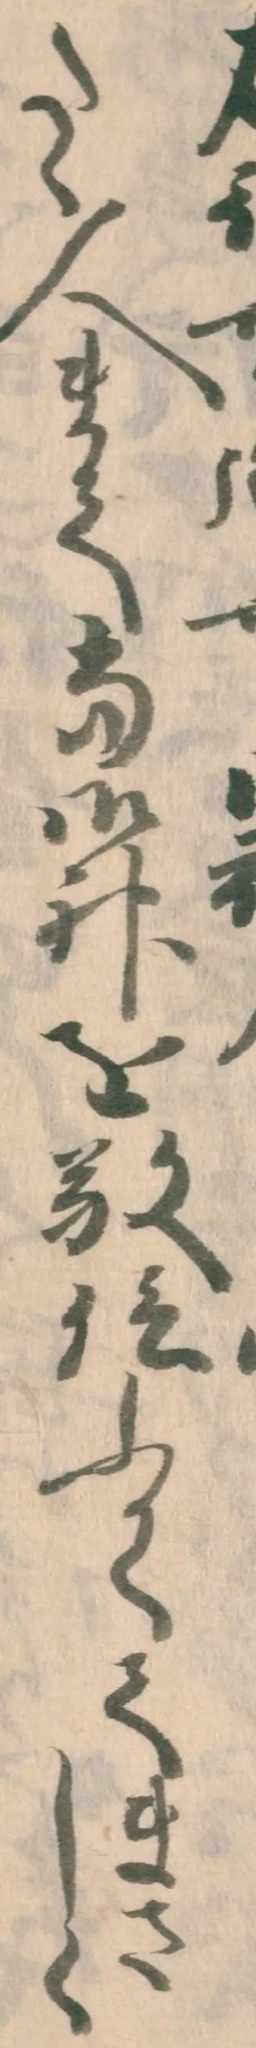たゝ人まて当御神を敬信ふかくてまさしく
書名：賀茂社記録. 第1冊
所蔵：国立国会図書館 National Diet Library, JAPAN
